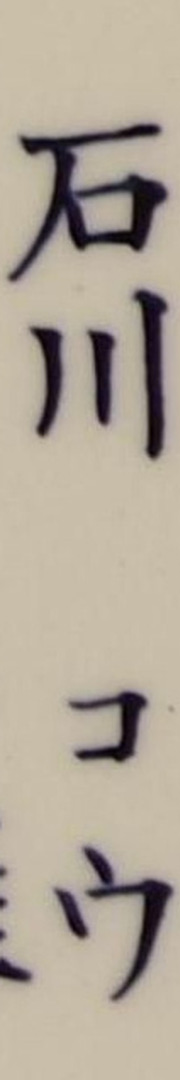石川コウ
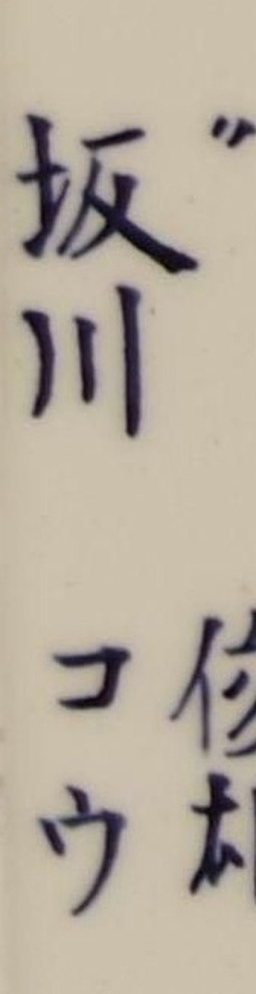坂川コウ

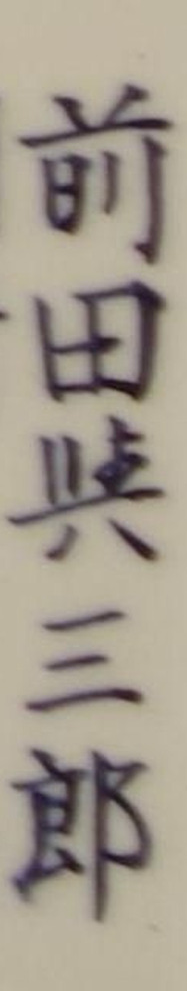前田与三郎
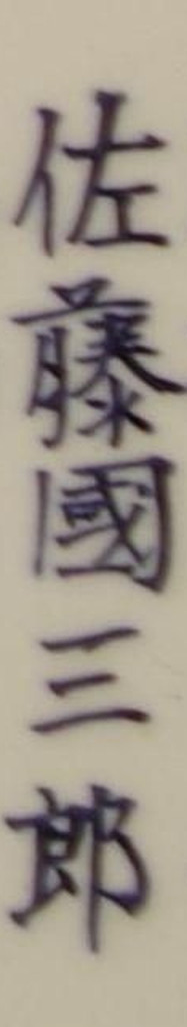佐藤国三郎
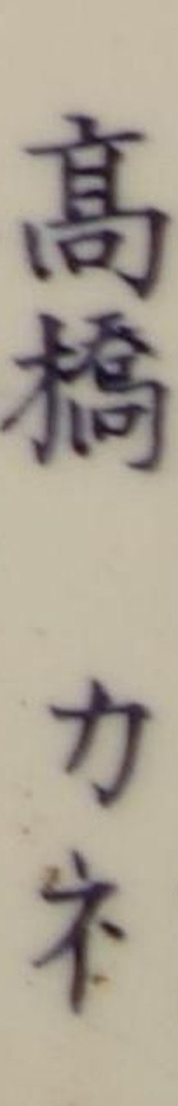高橋力ネ
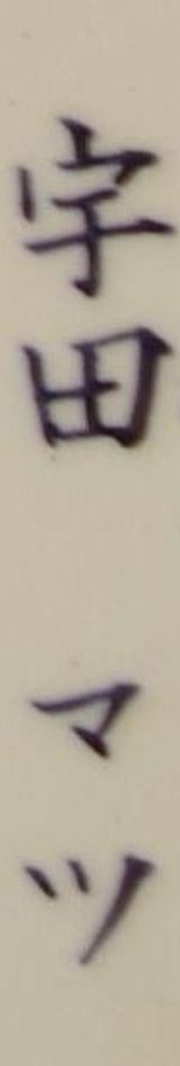宇田マツ
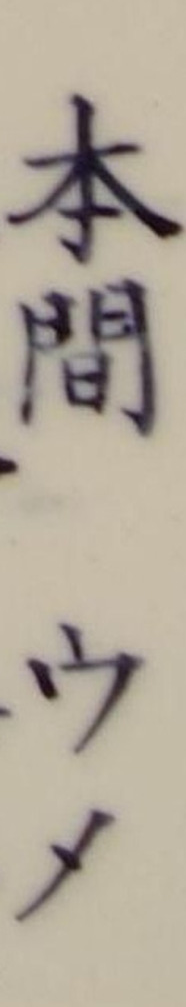本間ウメ
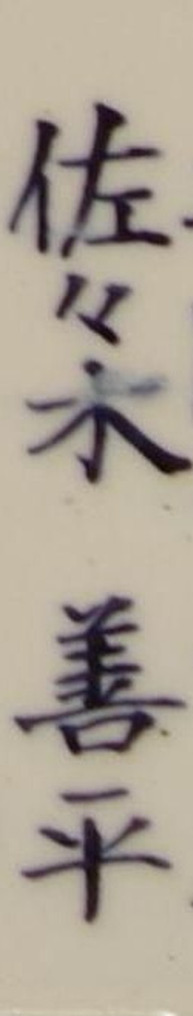佐々木善平
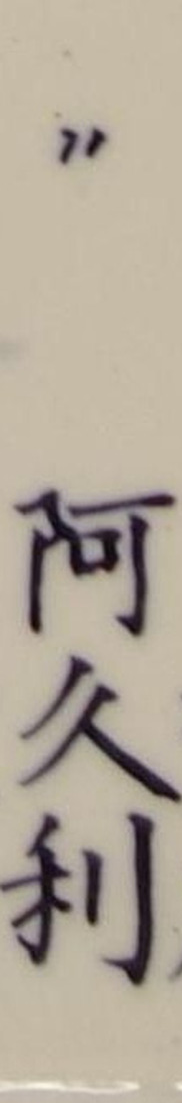阿久利
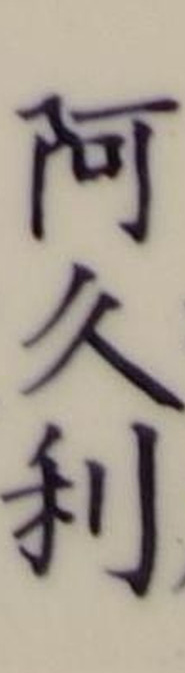阿久利
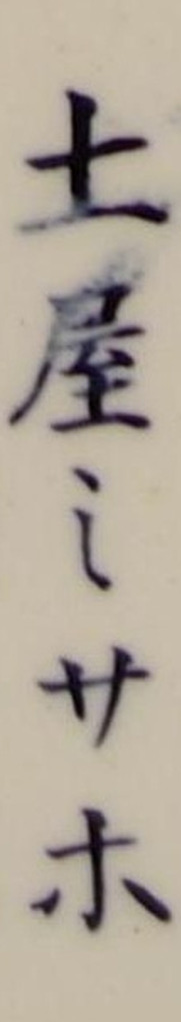土屋ミサホ
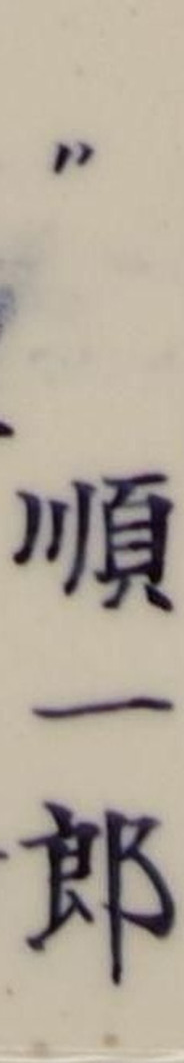順一郎
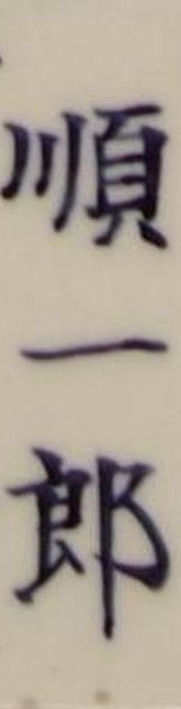順一郎
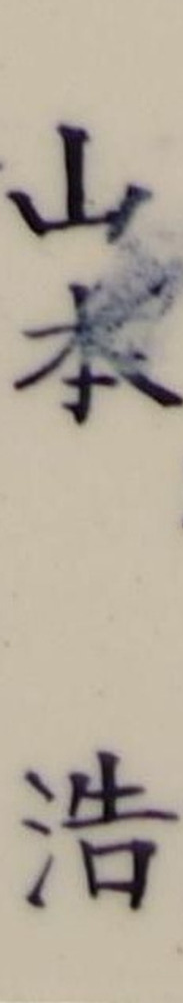山本浩
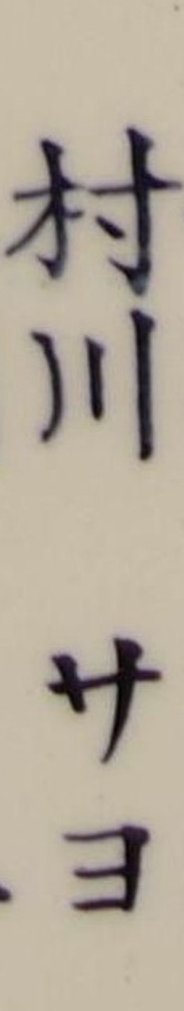村川サヨ
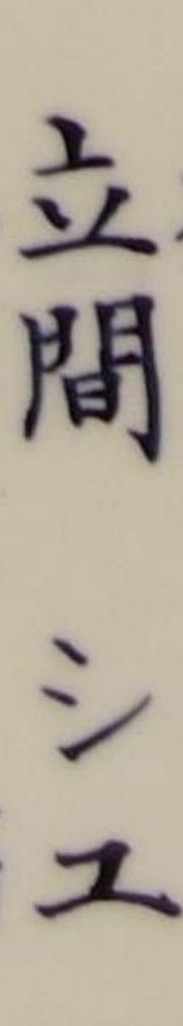立間シユ
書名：E~L
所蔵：高野山金剛峯寺
